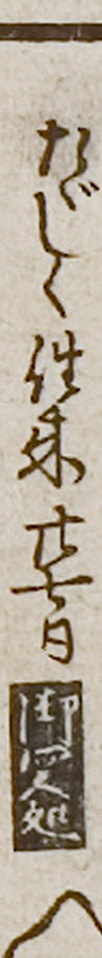たゞしく往来廿七日
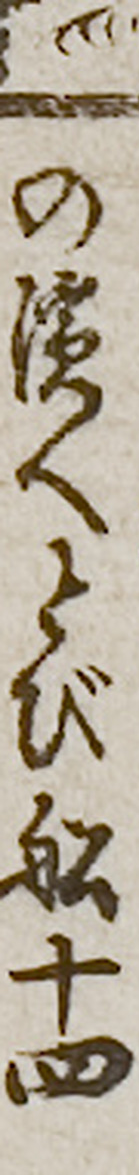の浜へとび船十四
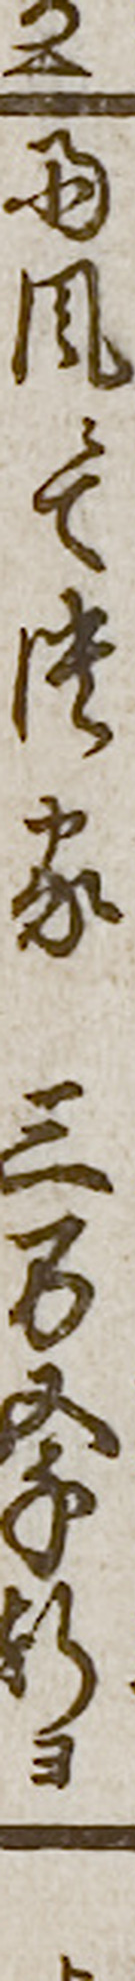雨風にて潰家三万五千軒よ
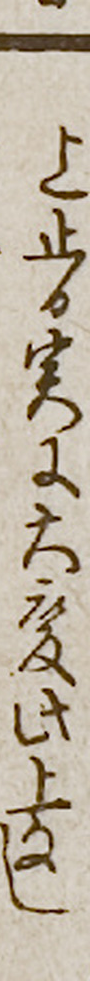迄止る実に大変此上なし
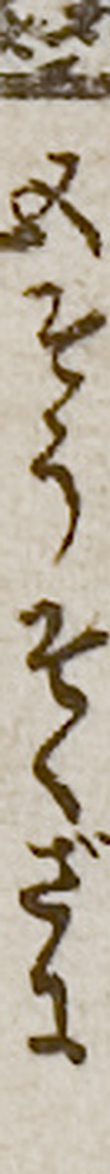五そうそくざに
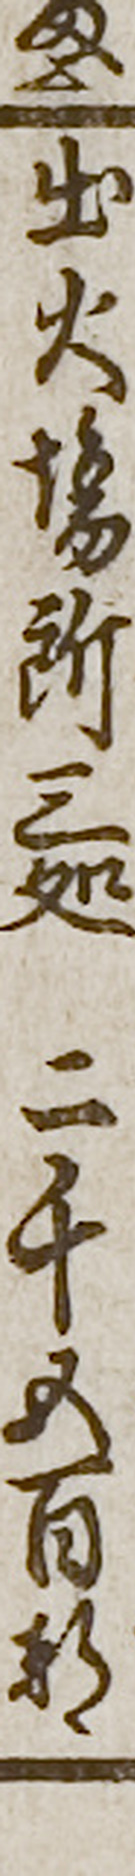出火場所三処二千五百軒
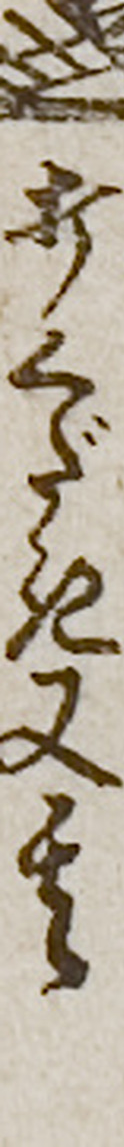打くだき又其
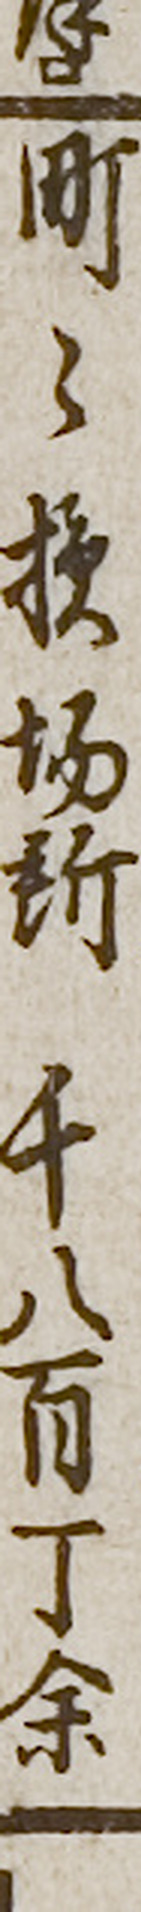町々損場所千八百丁余
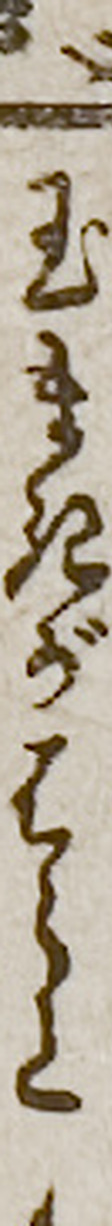玉まきがはらと
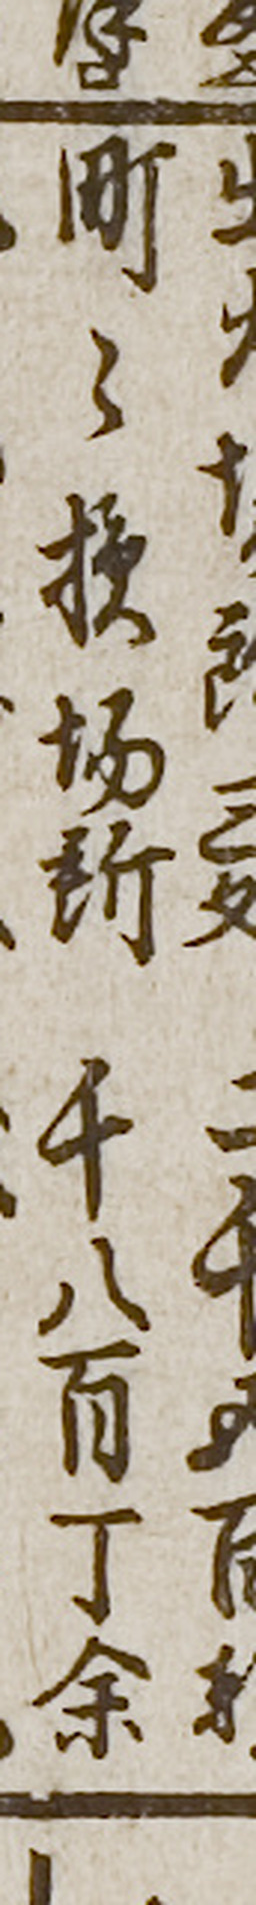町々損場所千八百丁余
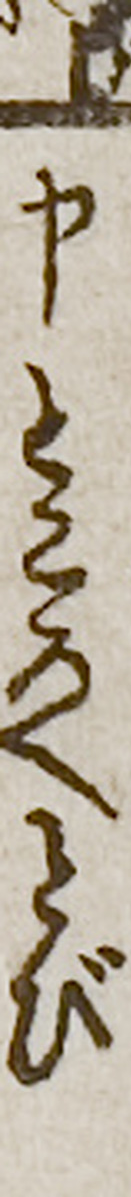申ところへとび
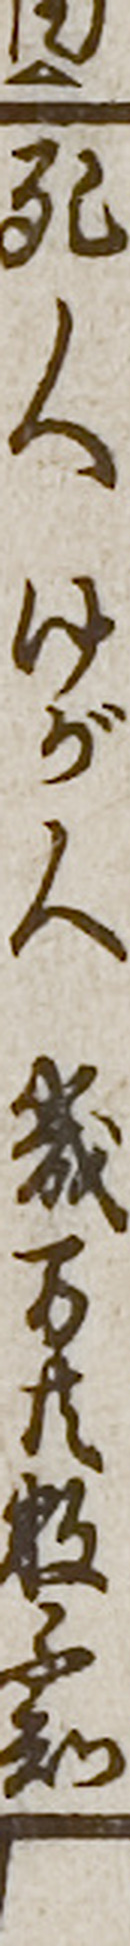死人けが人幾万共数不知
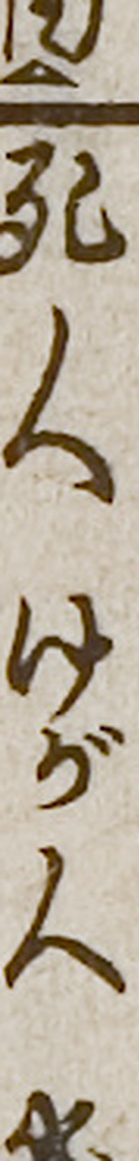死人けが人
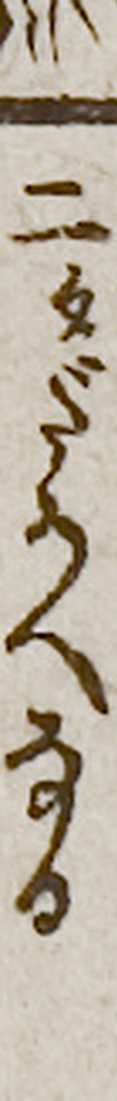二ただかへなる
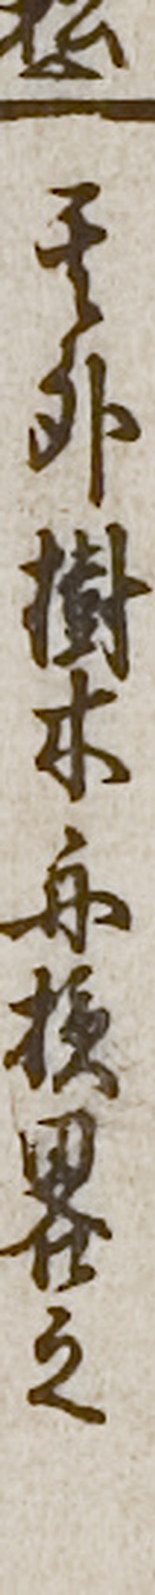其外樹木舟損略也
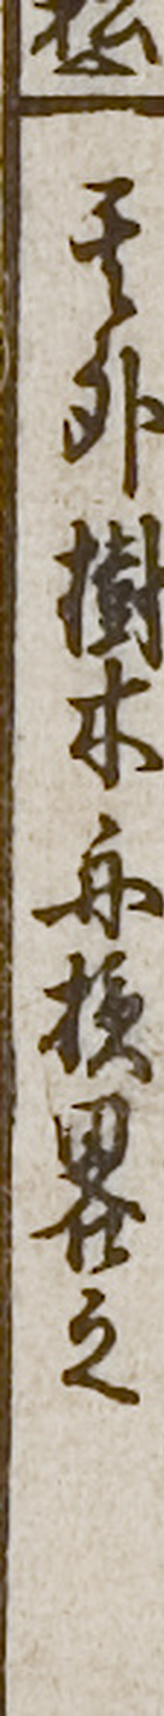其外樹木舟損略也
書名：江戸東海道東国荒珍事図
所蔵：東京大学総合図書館 General Library in the University of Tokyo, JAPAN
